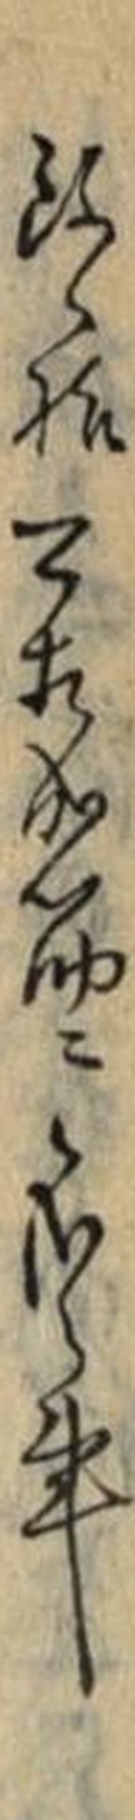致候様可相成筋に哉之事
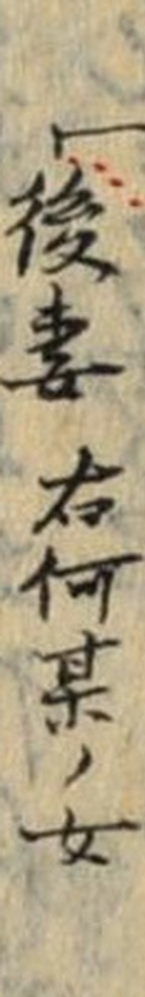後妻右何某ノ女
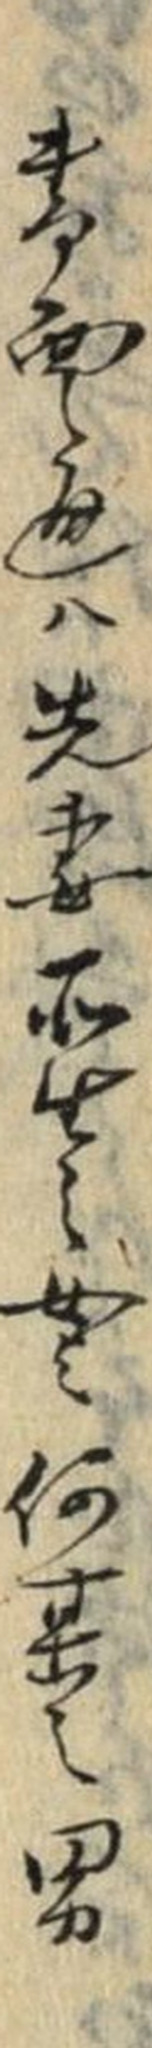書面之通は先妻所生之女と何某之男
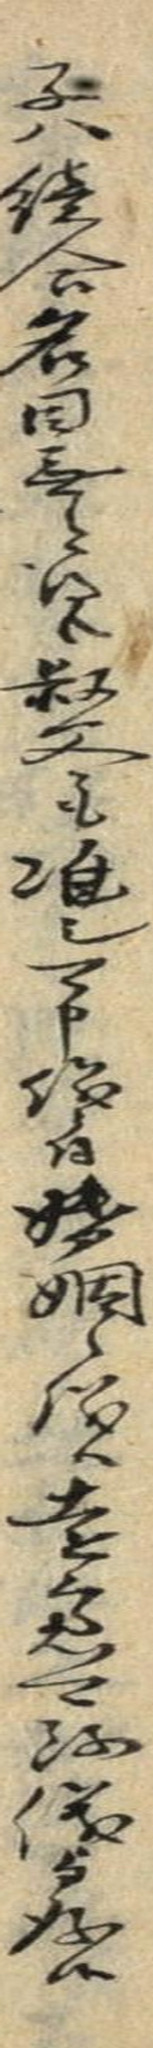子は続合名目無之候共叔父とも准し可申儀に付婚姻之儀は遠慮可致儀と存候
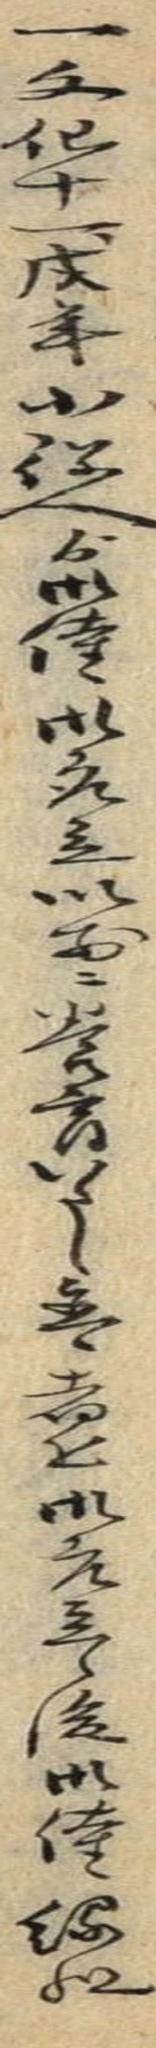一文化十一戌年小役人ゟ御侍へ御取立以前に養育いたし置候者を御取立候後御侍へ縁組
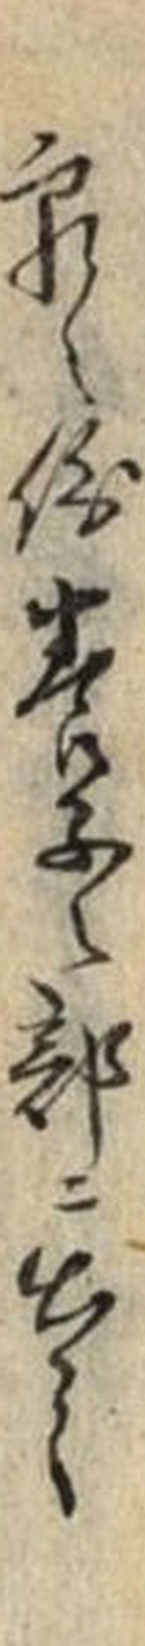願之儀養子之部に出之
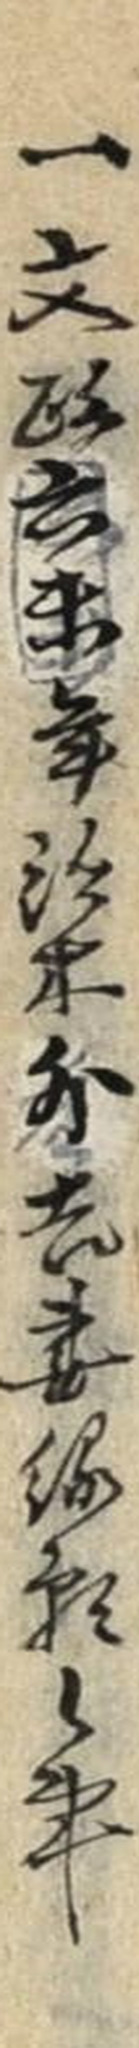一文化六年鈴木外吉妻縁願之事
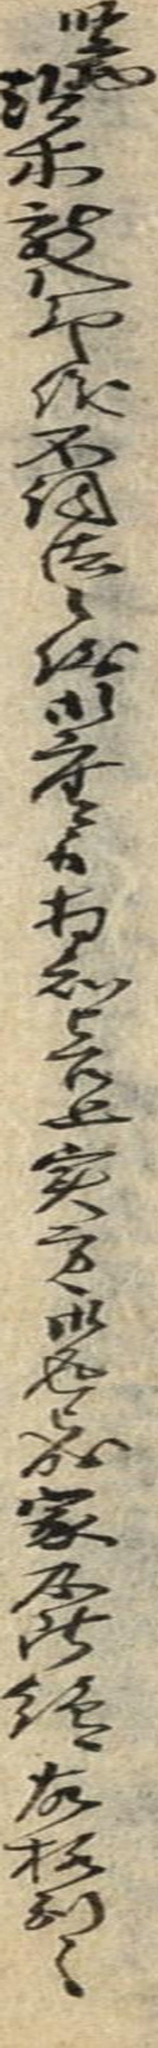鈴木新八郎儀不調法之儀御座候に付拝知被召上実方へ御返被成家及断絶候故格別之
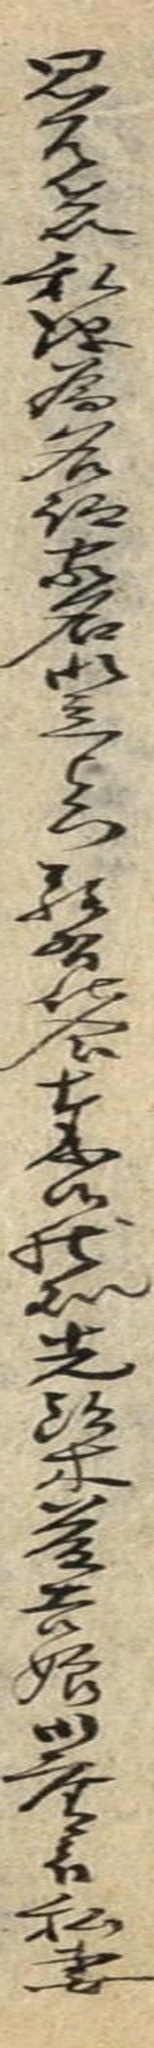思召を以私儀為名跡家名御立被下難有仕合奉存候然処先鈴木藤吉娘御座候に付私妻
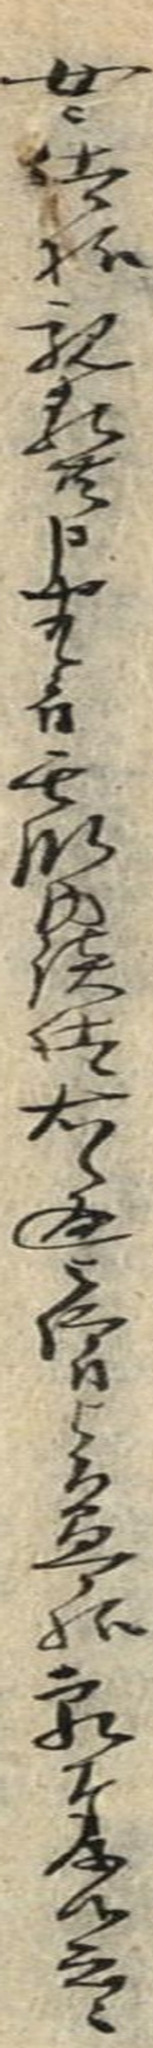女に仕候様親類共申聞候に付其段内談仕候右之通被仰付被下置候様願奉存候云々
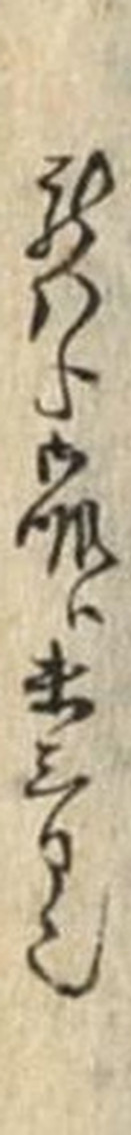新八郎御暇は未三月也
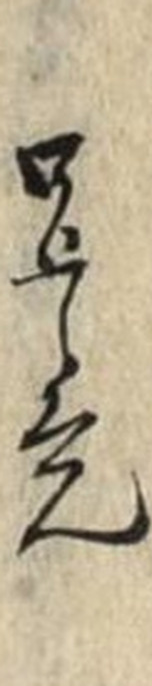口上之覚
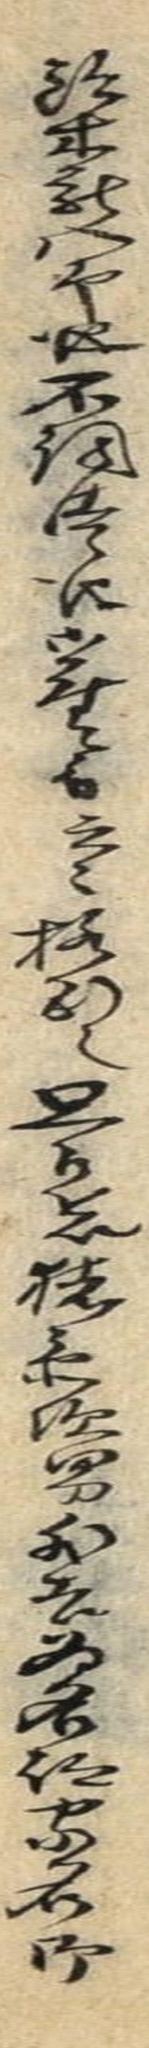鈴木新八郎儀不調法之儀御座候に付云々格別之思召うを以猪兵衛次男外吉為名跡家名御
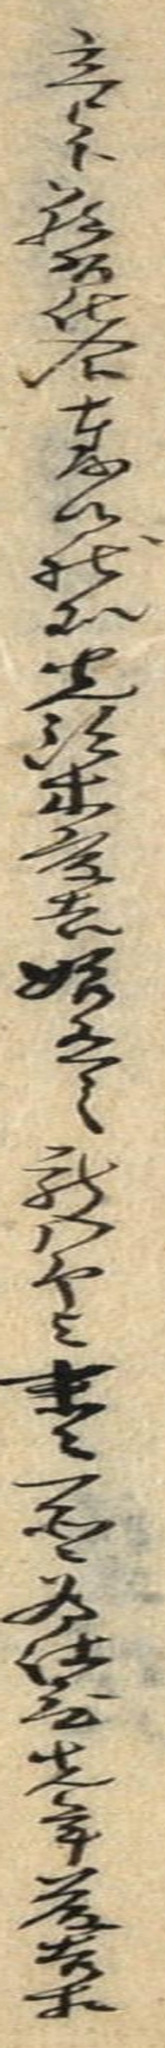立被下難有仕合奉存候然処先鈴木藤吉娘有之新八郎と末々一所に為仕度先年藤吉相
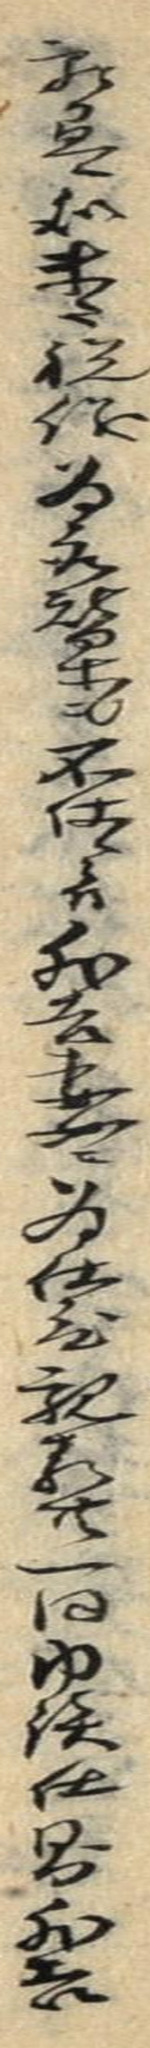願置候処未た祝儀為取替等も不仕候に付外吉妻女に為仕度親類一同内談仕則外吉

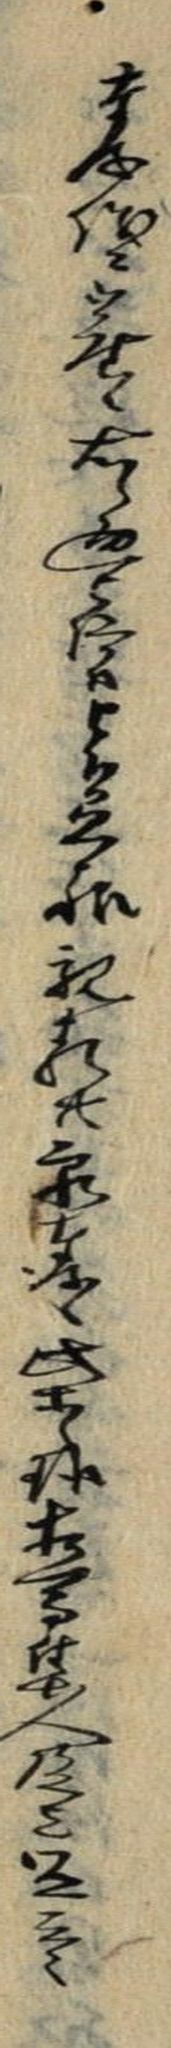奉存儀に御座候右之通被仰付被下置候様親類共願奉存候此等之趣相馬隼人殿迄宜云々
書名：養子縁組之部
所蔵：福井県文書館 Fukui Prefectural Archives
